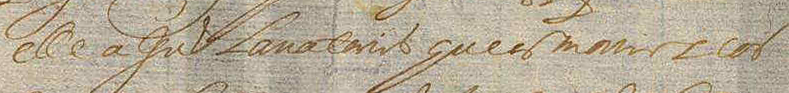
elle algūs Lauatorios que os mouros cos
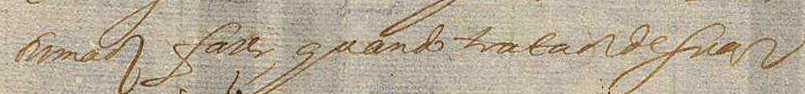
tumaõ fazer, quando trataõ de suas
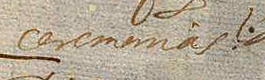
ceremonias?
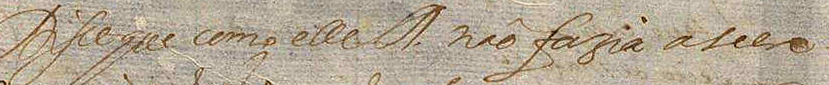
Disse que como elle R. naõ fazia as cere
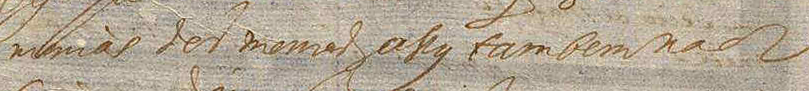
monias dos mouros assy tambem naõ
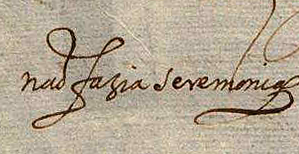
naõ fazia seremonias
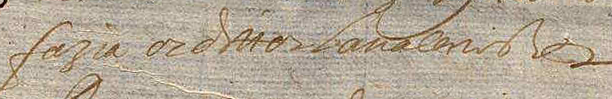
fazia os dittos lauatorios
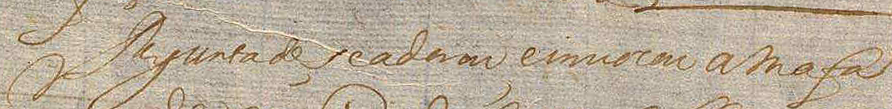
item Perguntado, se adorou e inuocou a mafa
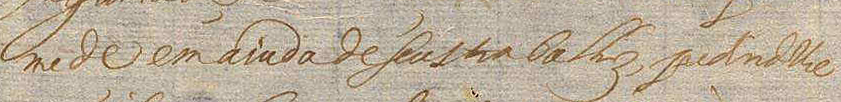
mede em aiuda de seus trabalhos, pedindolhe
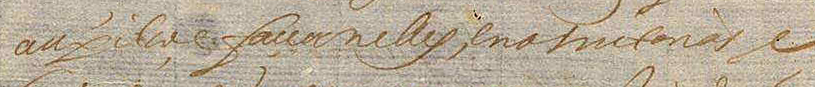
auxilio e fauor nelles, e nas uictorias e
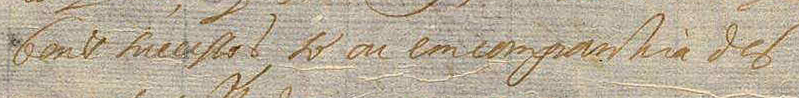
bons sucessos, só ou em companhia dos
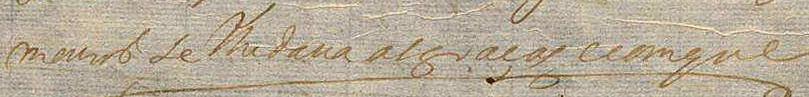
mouros se lhe daua as graças e com que
